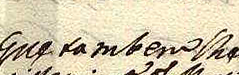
Que tambem lhe
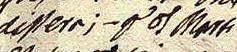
dissera; q̄ os Marti
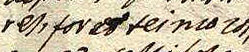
res, foraõ teimozos,
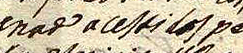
e naõ acestidos pe
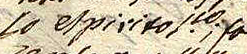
Lo espirito s.to; fa
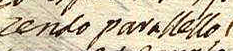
zendo parallello
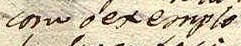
com o exemplo
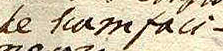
de hum faci
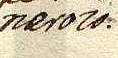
nerozo.
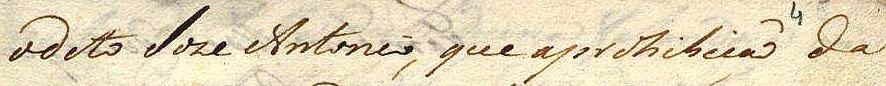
o dito Ioze Antonio, que a prohibiçaõ da
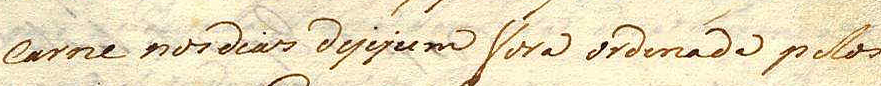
carne nos dias de jejum fora ordenada pelos
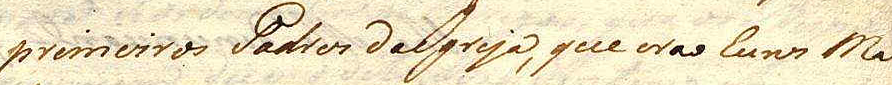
primeiros Padres da Igreja, que erao huns Ma
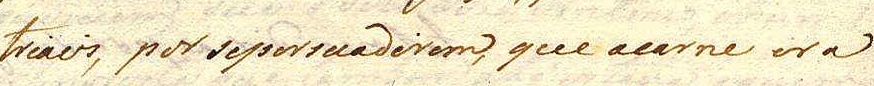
triaeis, por se persuadirem, que a carne era
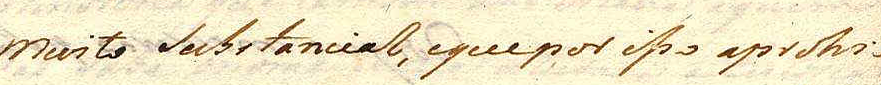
muito substancial, e que por isso a prohi
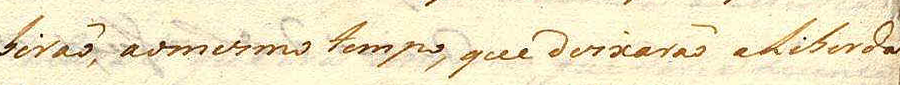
biraõ, ao mesmo tempo, que deixaraõ e Liberda
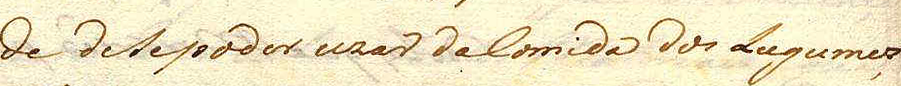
de de sepoder uzar da Comida dos Legumes,
